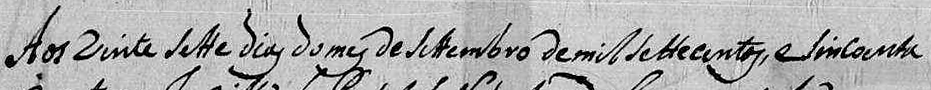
Aos vinte sette dias do mes de settembro de mil settecentos, e sincoenta
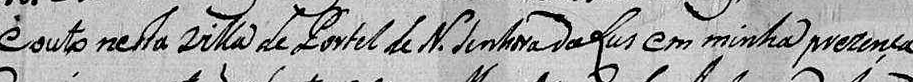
E outo nesta Villa de Portel de N. Senhora da Lus em minha prezença
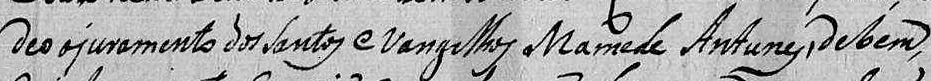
deo o juramento dos Santos evangelhos Mamede Antunes, de bem,
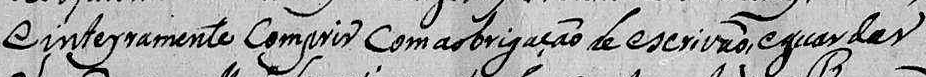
E inteyramente Comprir com a obrigaçaõ de escrivaõ, e guardar
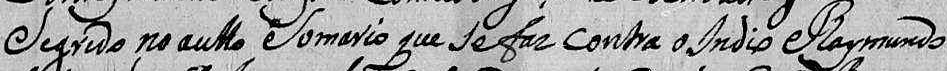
Segredo no autto Somario que se faz contra o Indio Raymundo
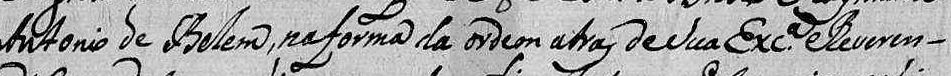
Antonio de Belem, na forma da ordem atras de Sua Exc.a e Reveren
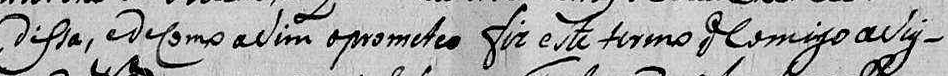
dissa, e de Como asim o prometeo fiz este termo q̄ Comigo asig
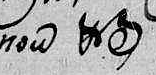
nou
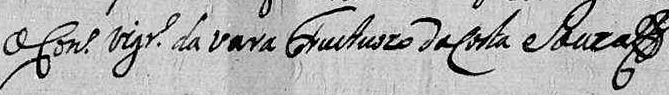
O Con.o vigr.o da vara Fructuozo da Costa e Souza
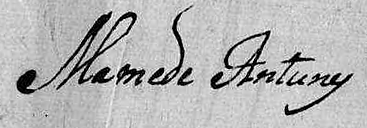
Mamede Antunes
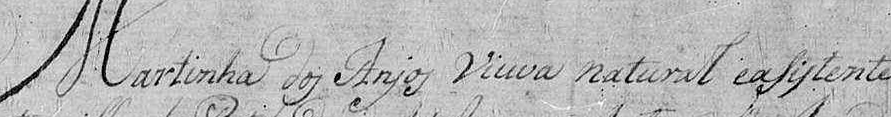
Martinha dos Anjos Viuva natural e asistente
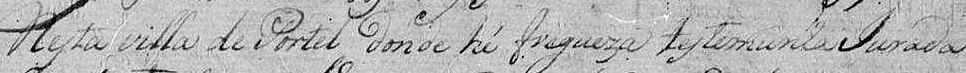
Nesta villa de Portel donde hé fregueza testemunha Iurada
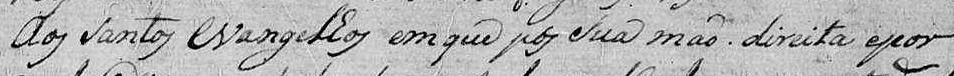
Aos Santos Evangelhos, em que pos sua maõ. direita e por
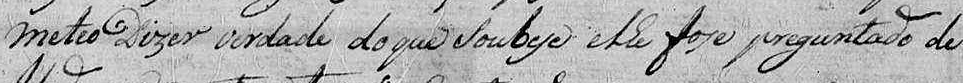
meteo Dizer verdade do que soubese e lhe fose preguntado de
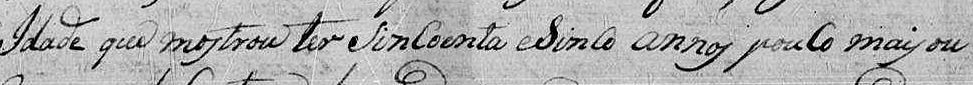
Idade que mostrou ter sinCoenta e SinCo annos pouco mais ou
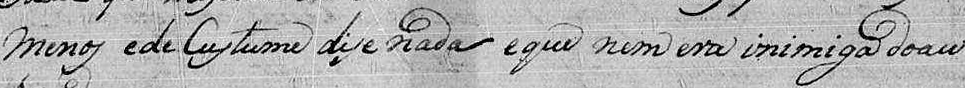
menos, e de Custume dise nada, e que nem era inimiga do au
